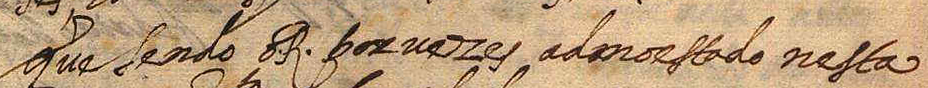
Que sendo o .R. por uezes admoestado nesta
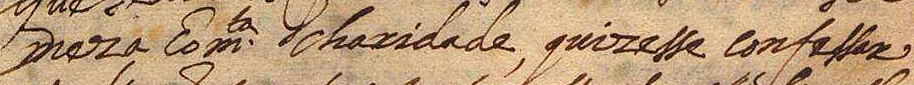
meza cō m.ta charidade, quizesse confessar
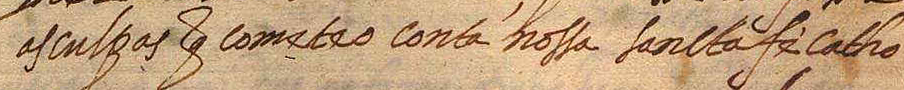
as culpas q̄ cometeo conta nossa sancta fé catho
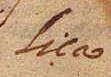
lica
